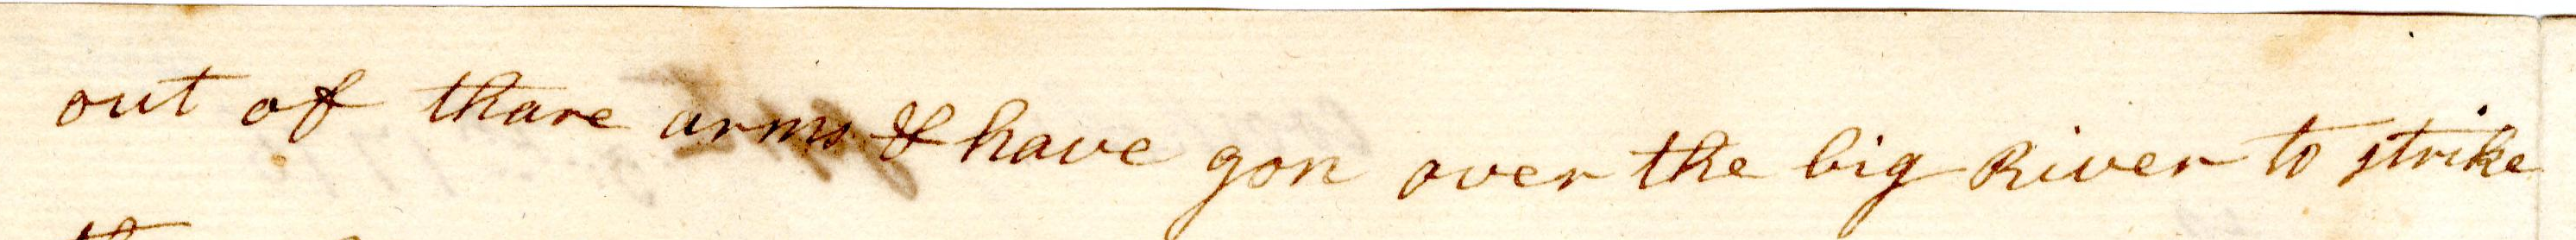out of thare arms & have gon over the big River to strike
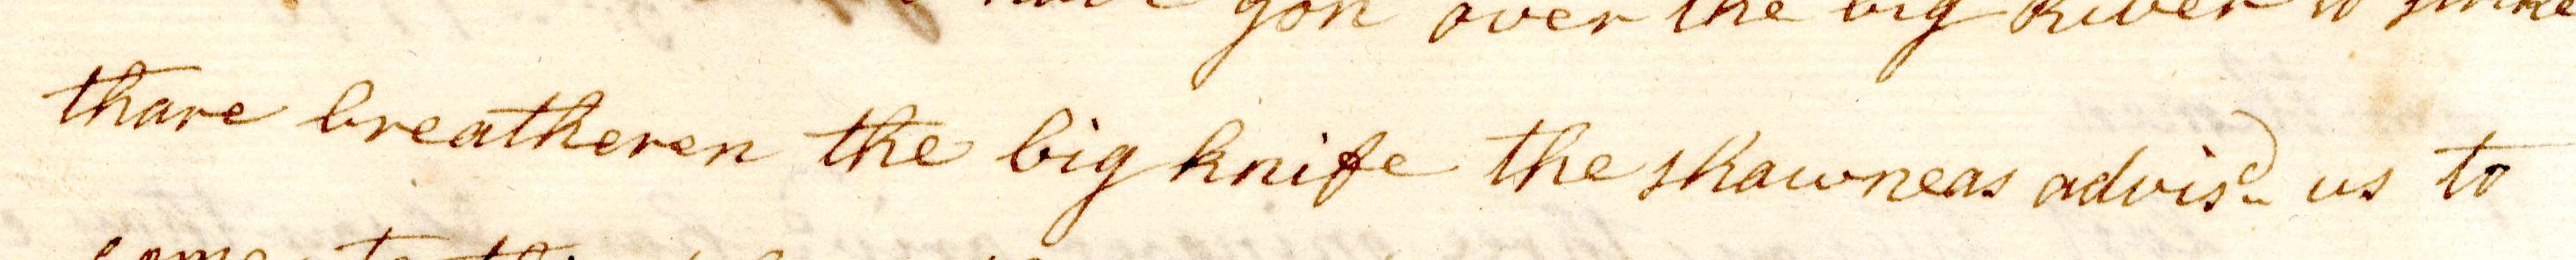thare breatheren the big knife the shawneas advis^d us to
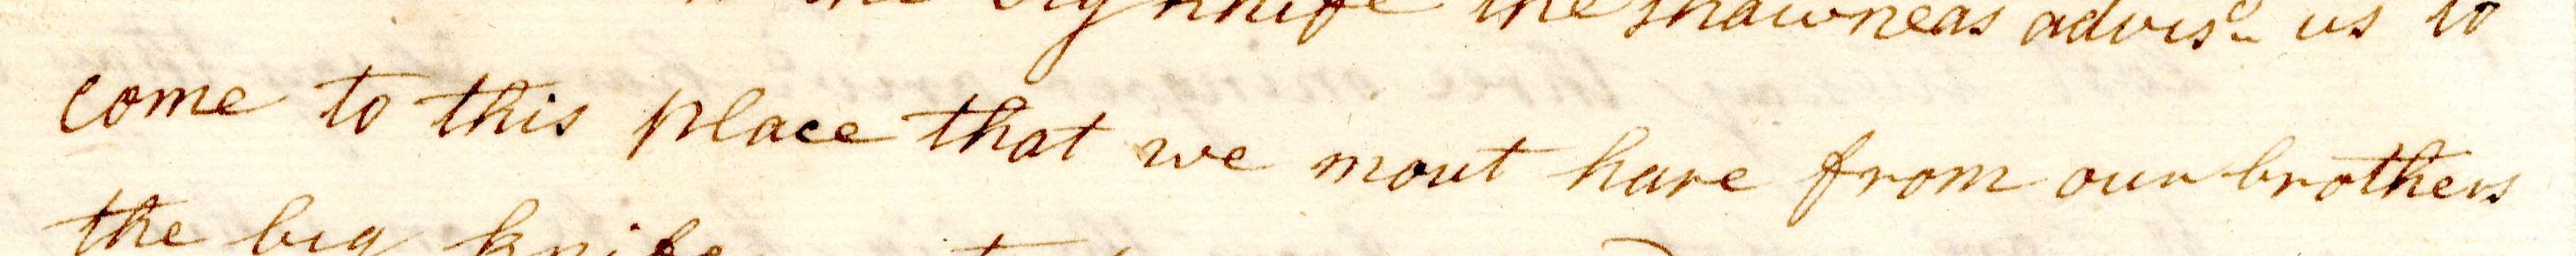come to this place that we mout hare from our brothers
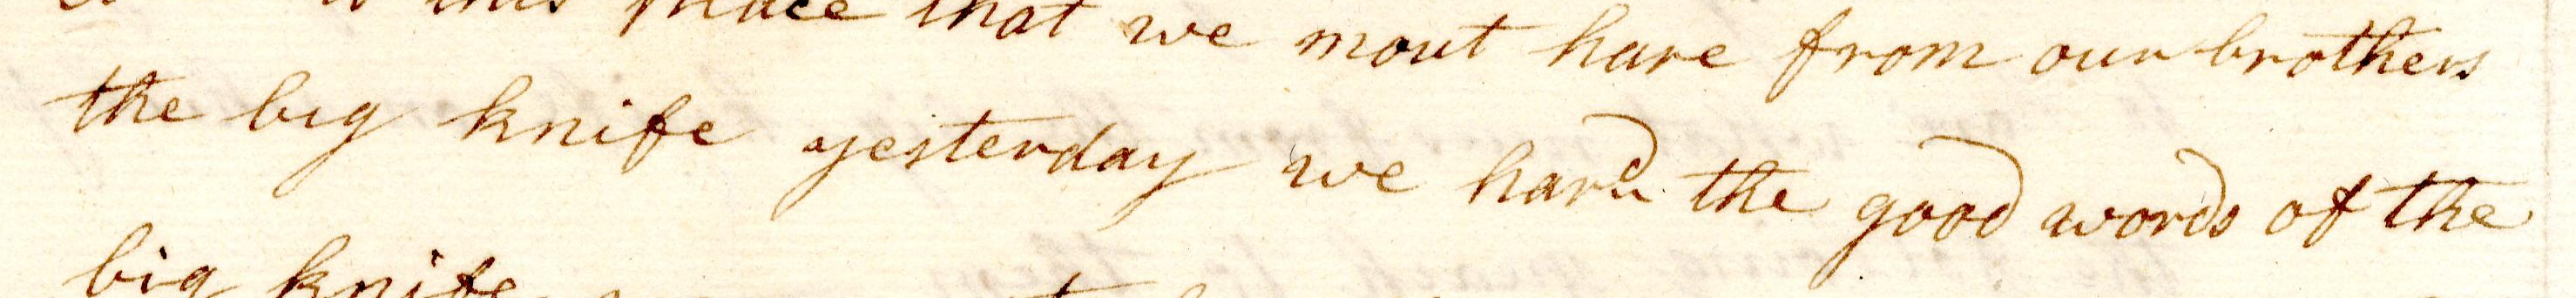the big knife yesterday we har^d the good word of the
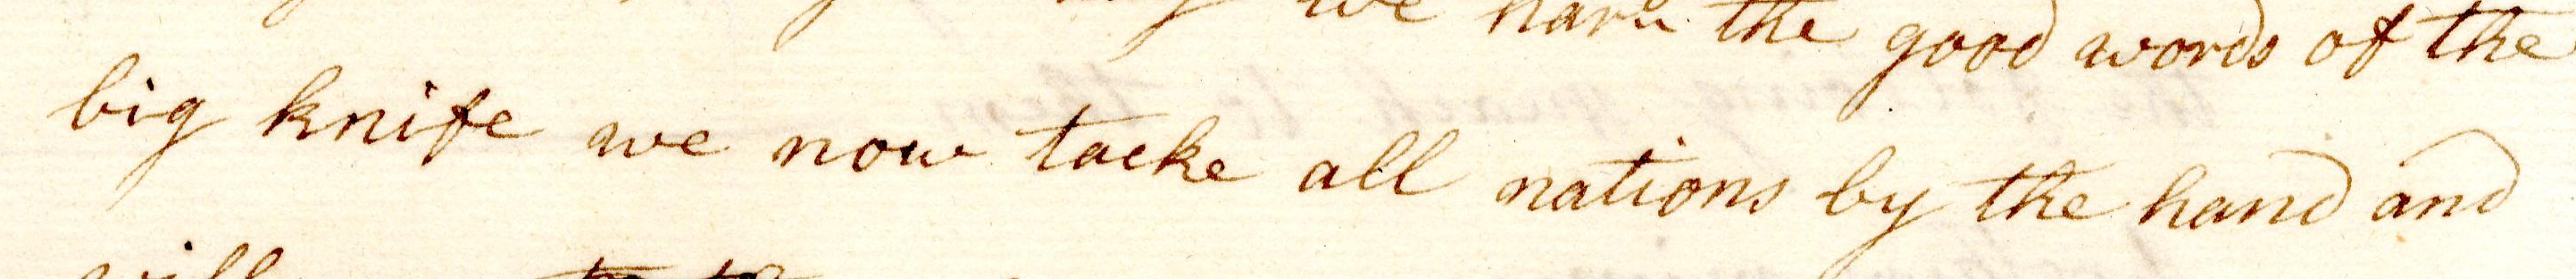big knife we now tacke all nations by the hand and
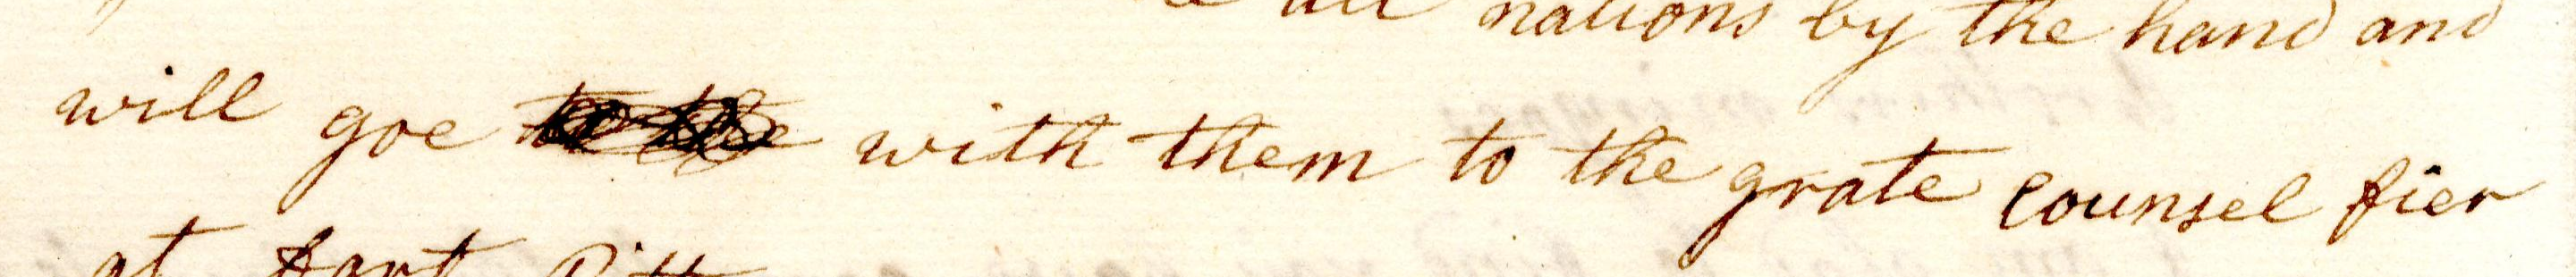will goe [to the] with them to the grate counsel fier
